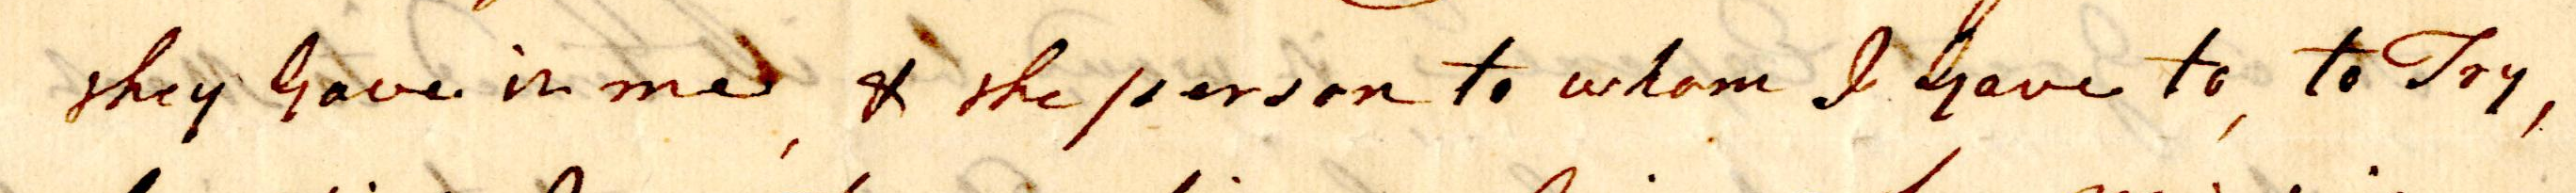they Gave in me & the person to whom I Gave to, to Try
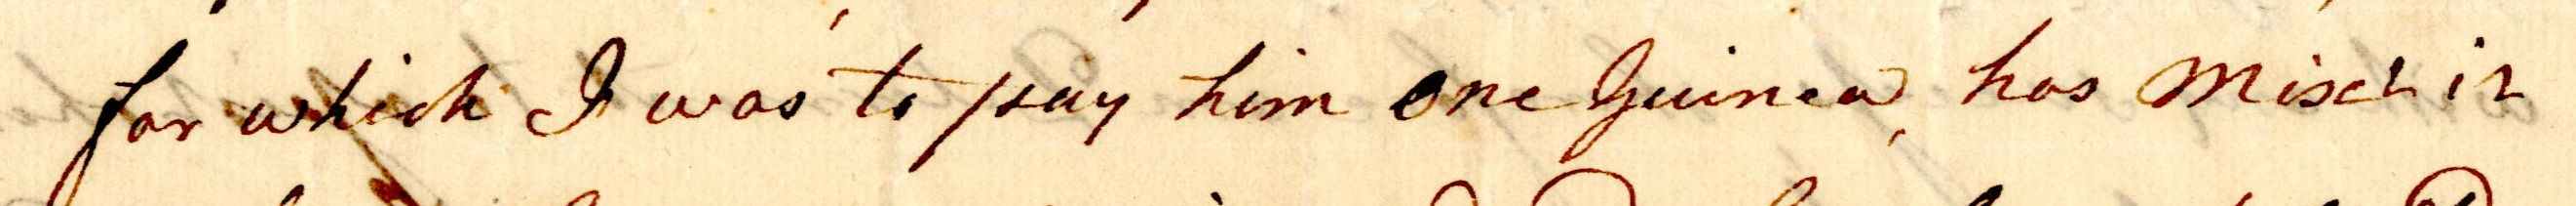for which I was to pay him one Guinea, his Misch in
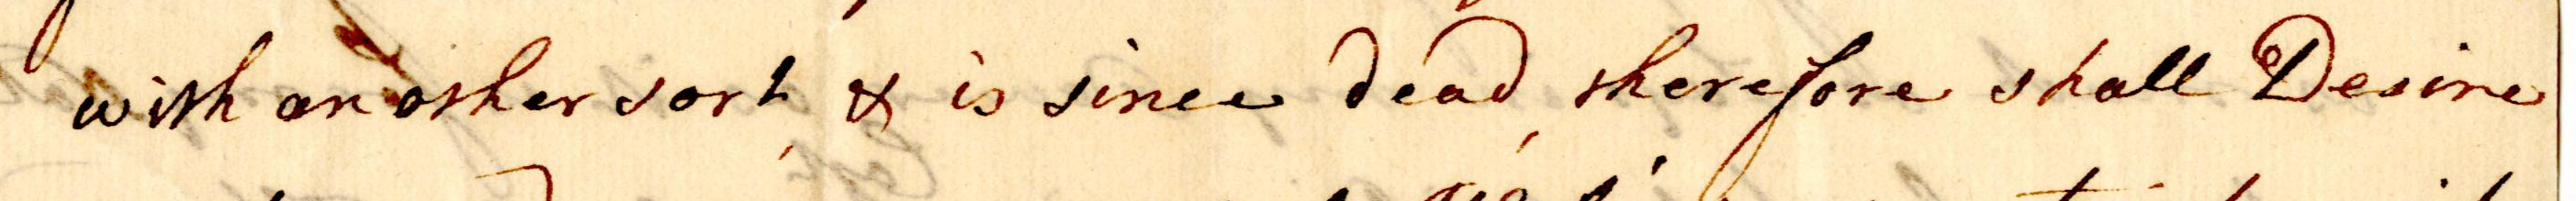with an other sort & is since dead therefore shall Desire
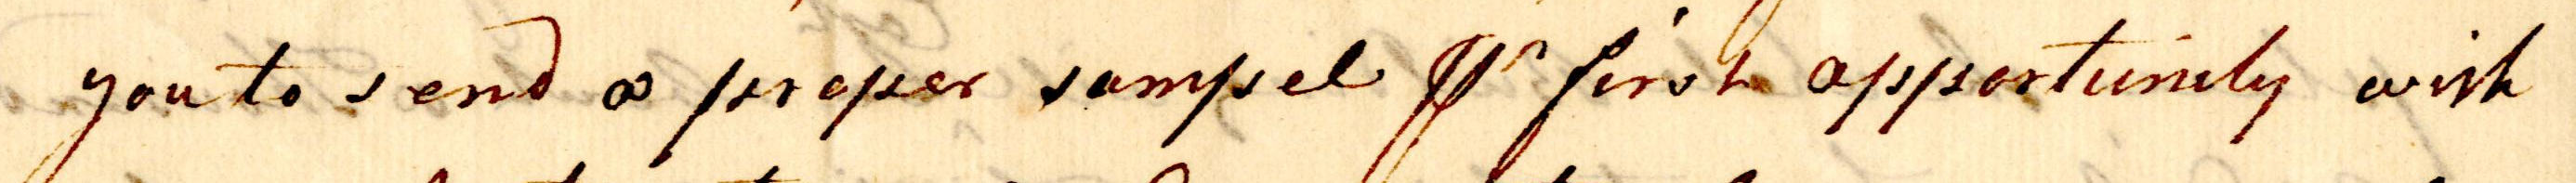you to send a proper sampel p^r first opportunity with
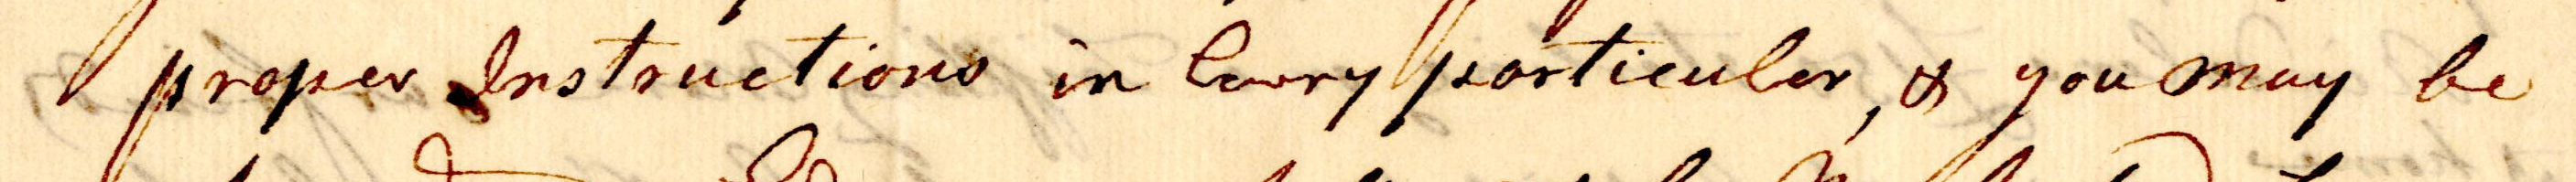& proper Instructions in Every particuler, & you may be
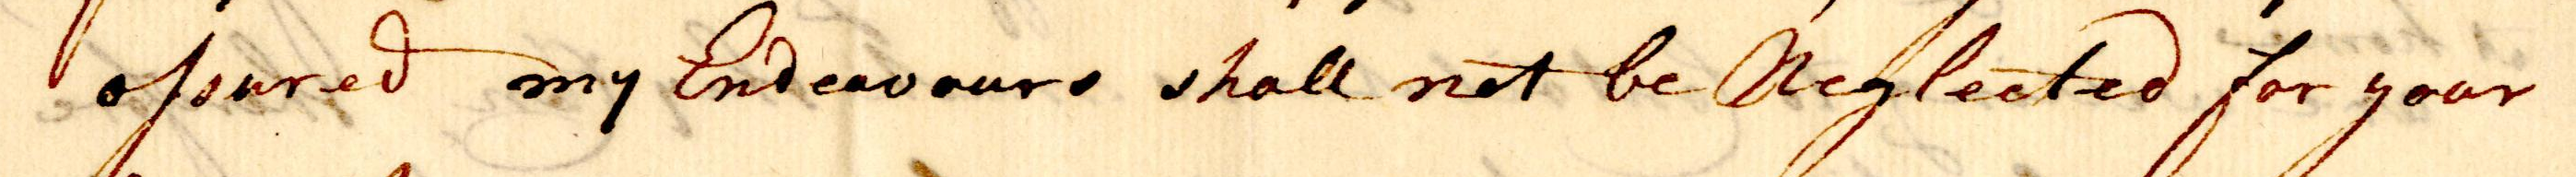assured my Endeavours shall not be neglected for your
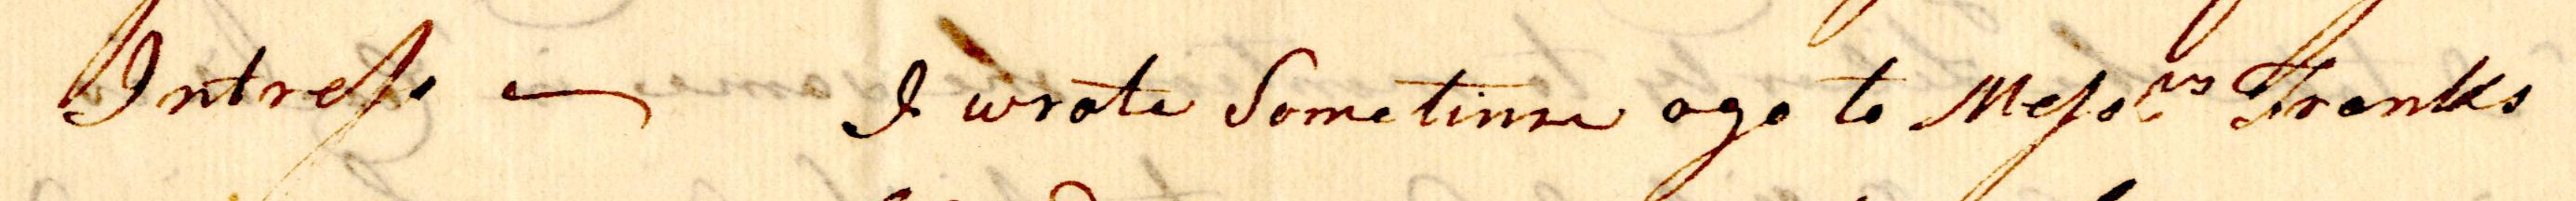Intress- I wrote sometime ago to Mess^rs. Franks
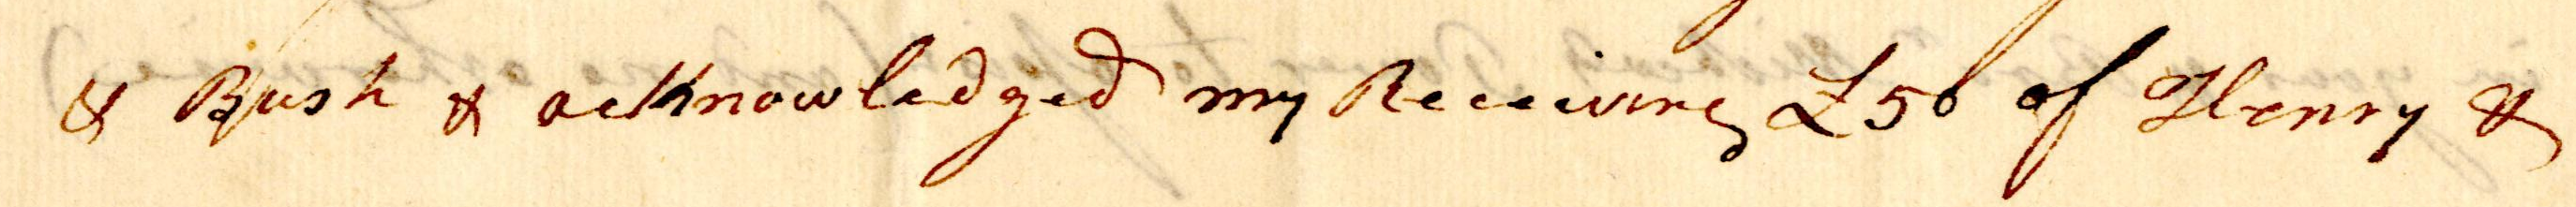& Bush & acknowledged my Receiving £50 of Henry &
